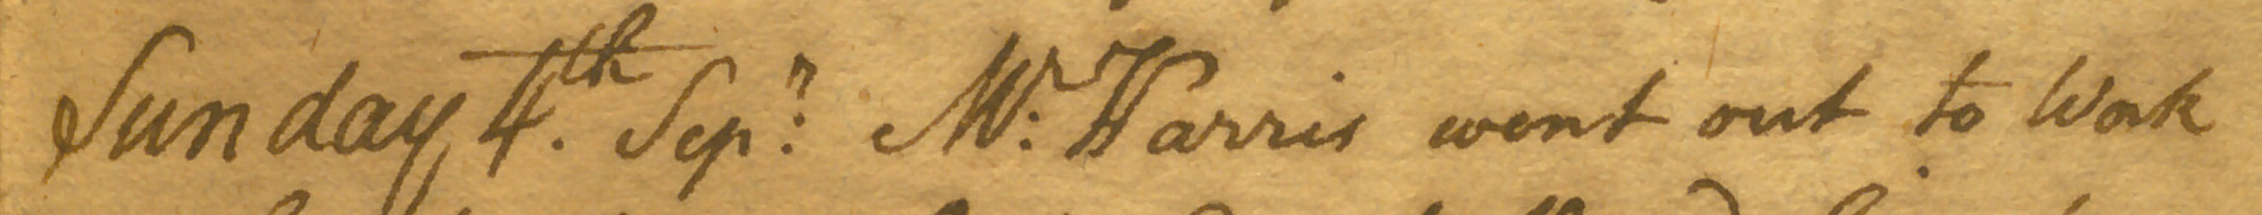Sunday 4^th. Sep^r: M^r: Harris went out to work
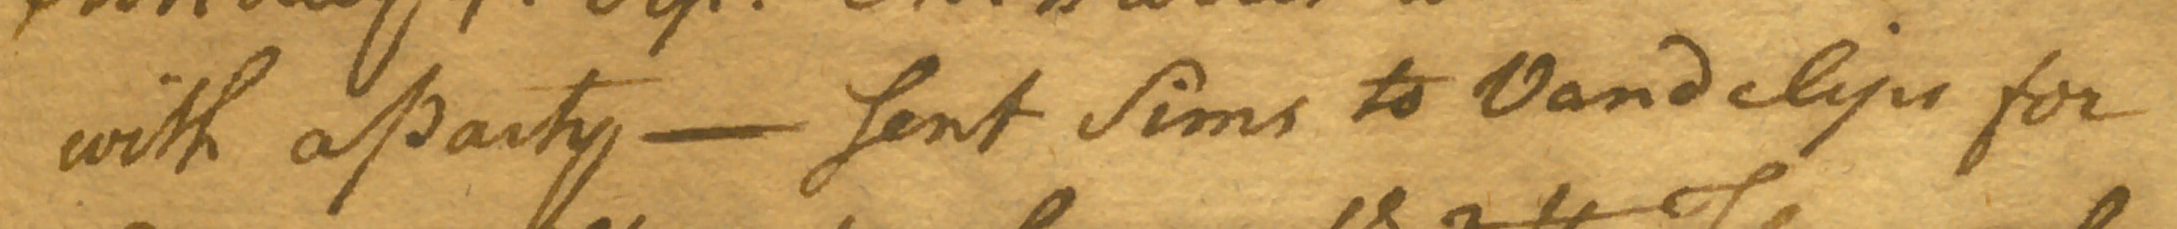with a party- sent Sims to Vandelips for
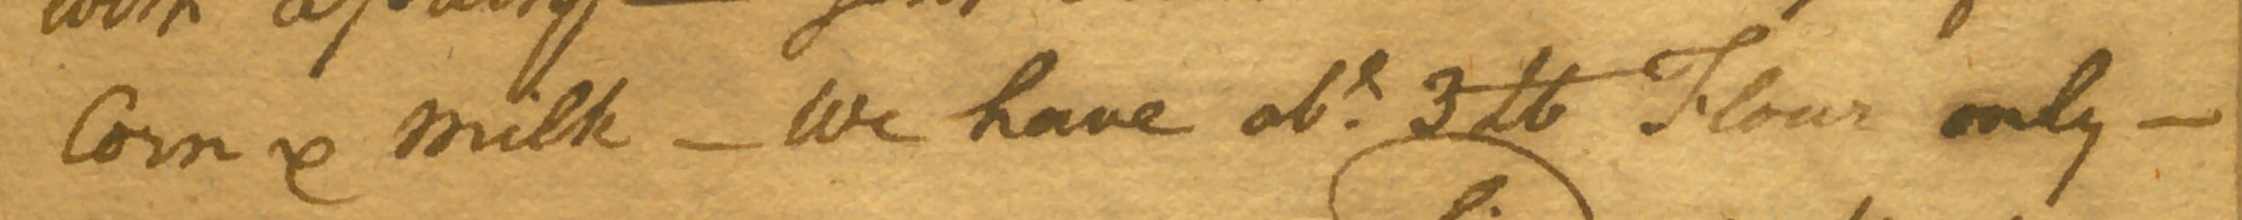corn & milk- We have ab^t. 3 Lb Flour only-
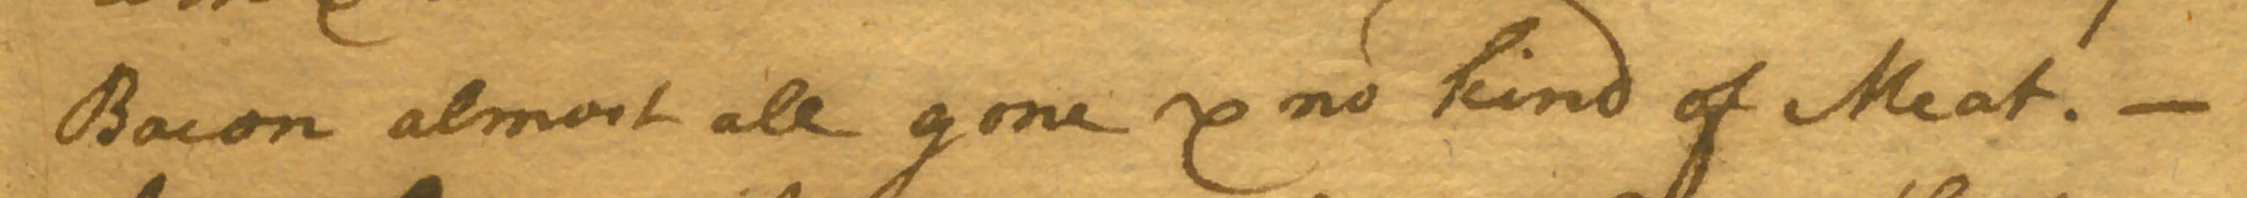Bacon almost all gone & no kind of Meat.-
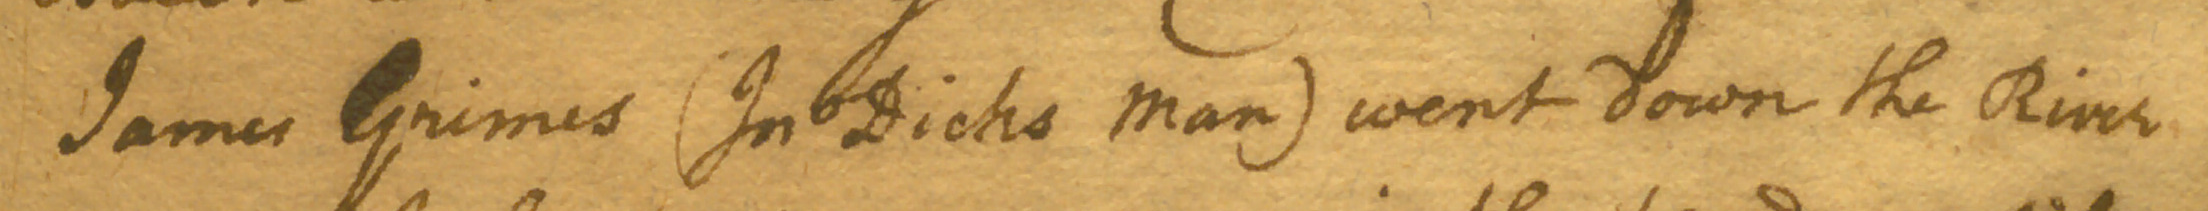James Grimes (Jn^o Dicks man) went down the River
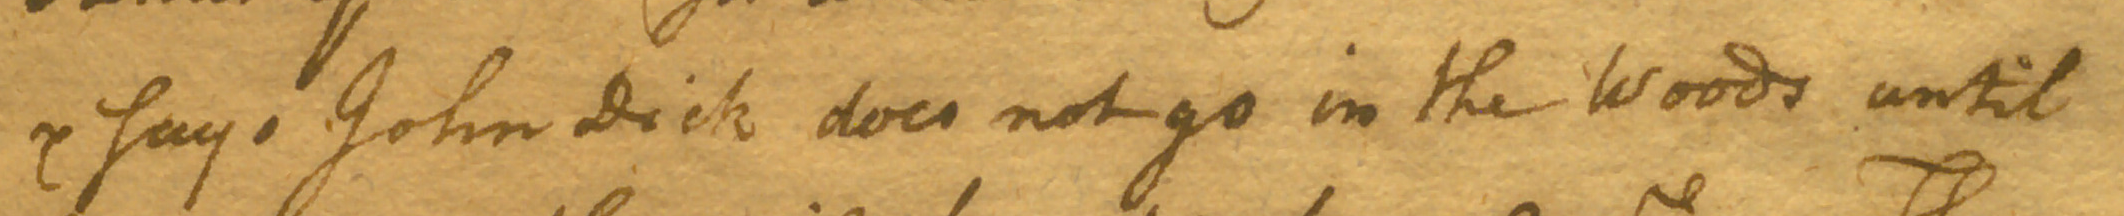& says John Dick does not go in the woods until
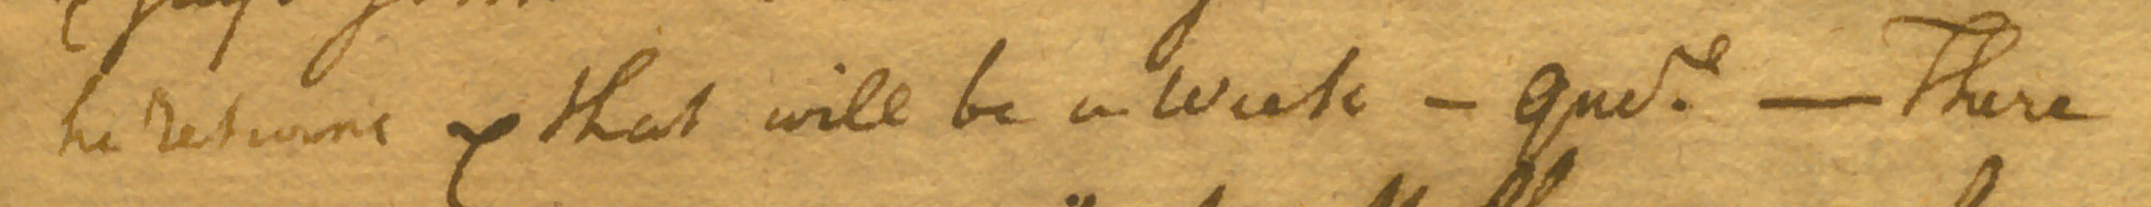he returns & that will be a week- acc^t.- There
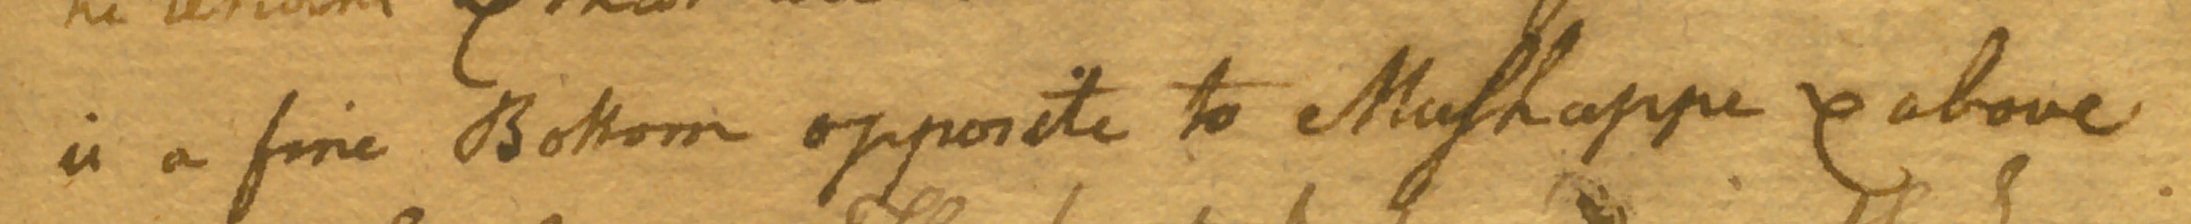is a fine Bottom opposite to Mushappe & above
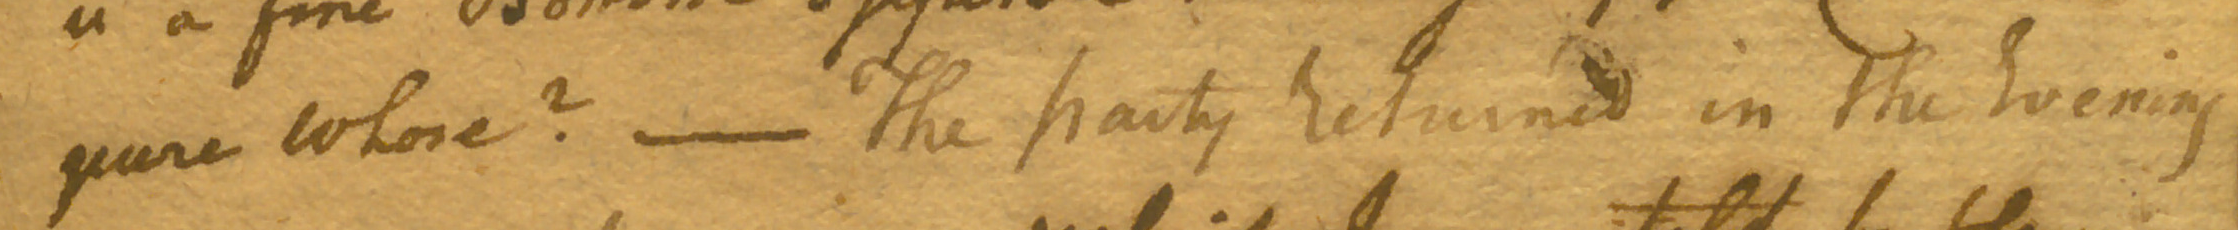were whose?- The party returned in the Evening
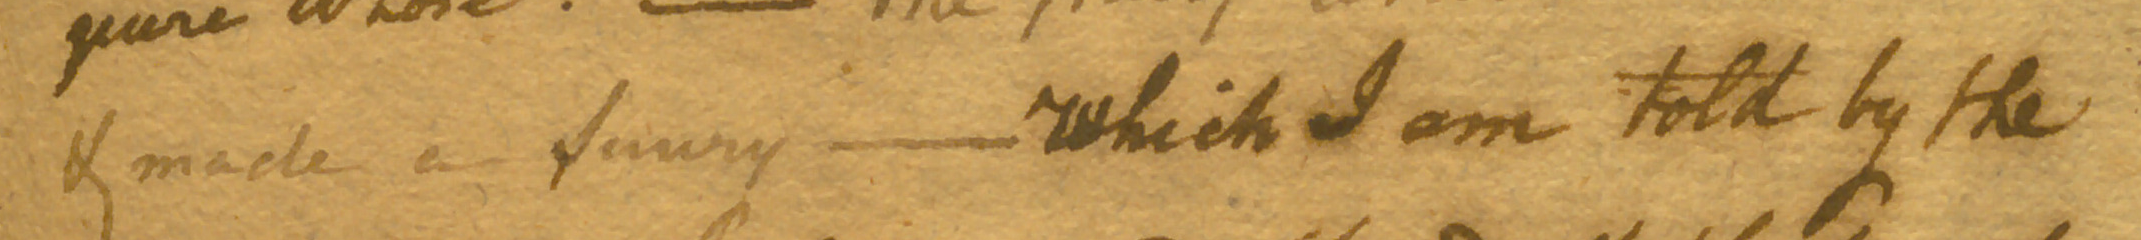& made a survey- which I am told by the
